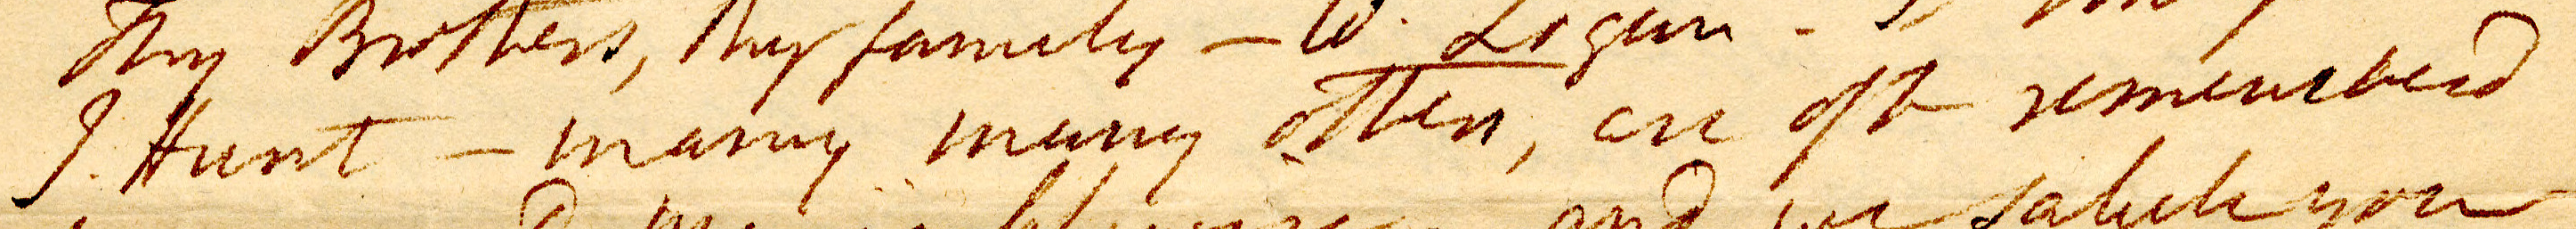J. Hunt- many many others are often rememberd
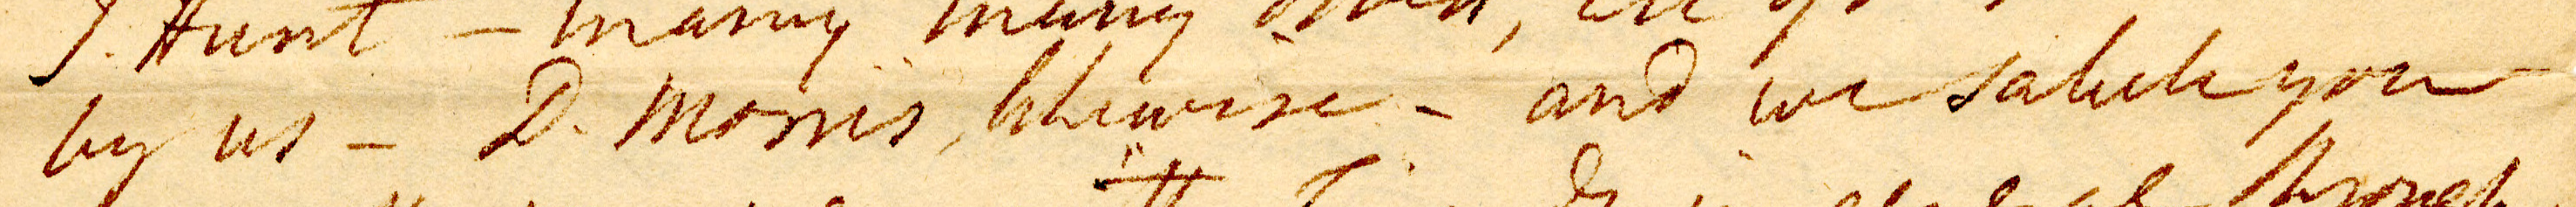by us- D. Morris likewise- and we salute you
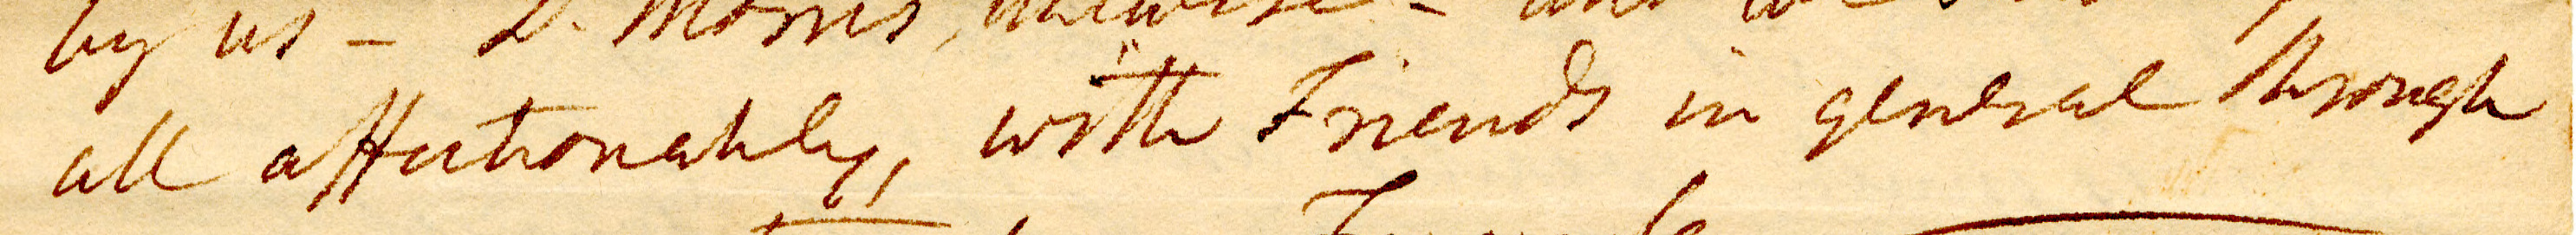all affectionately, with Friends in general through
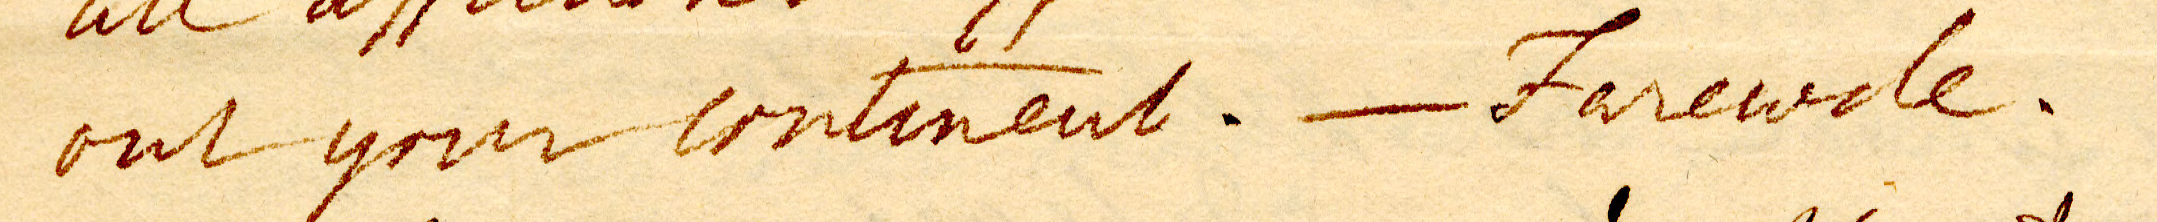out your continent.- Farewell.
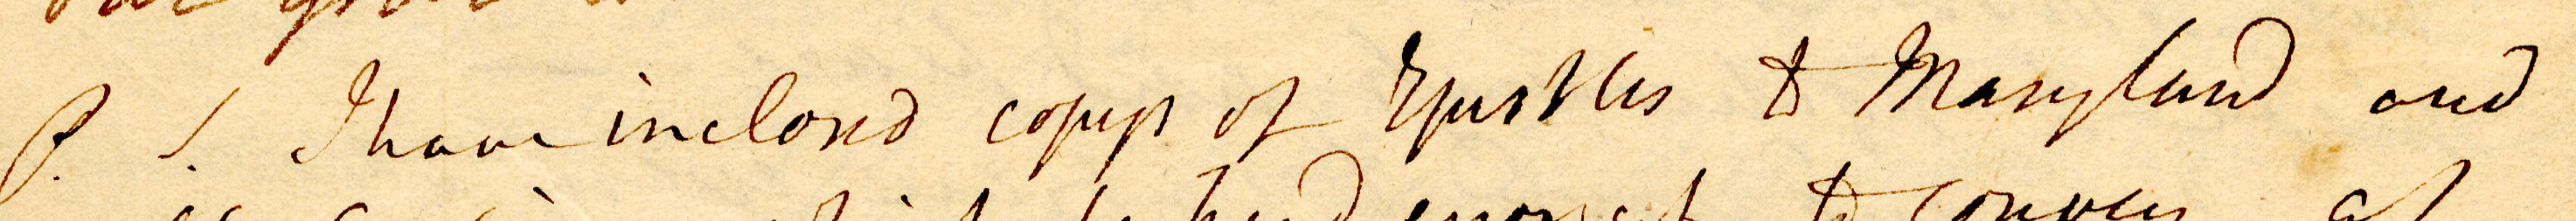P.S. I have inclosd copies of Epistles to Maryland and
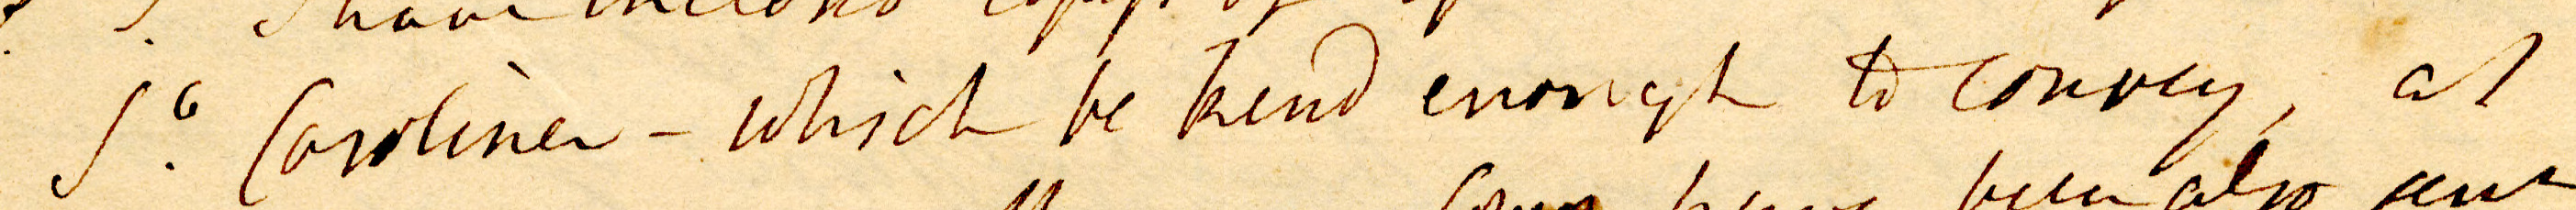S^o. Carolina- which be kind enough to convey, as
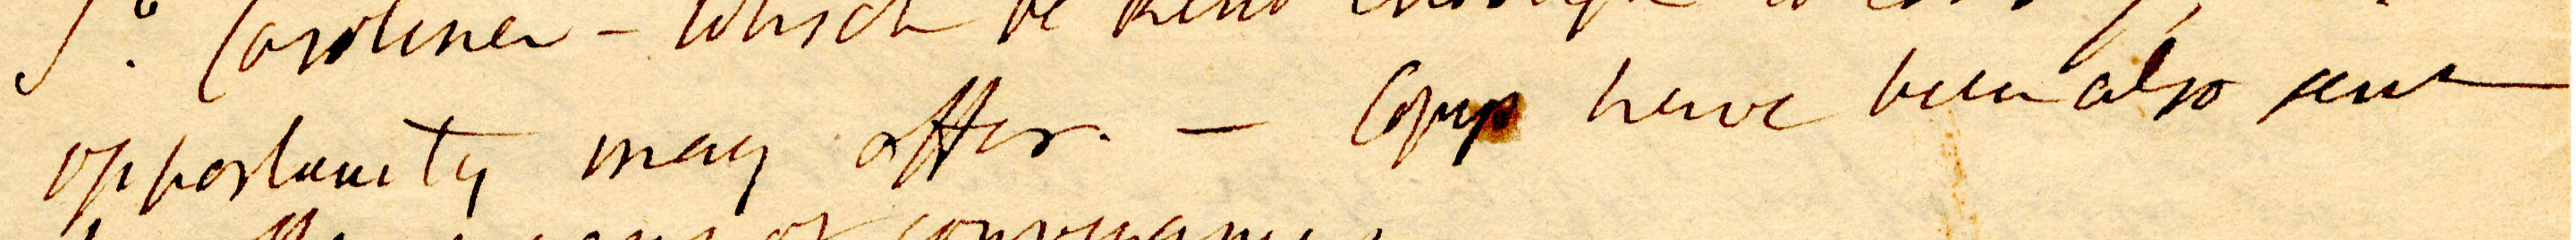opportunity may offer- Copys have been also sent
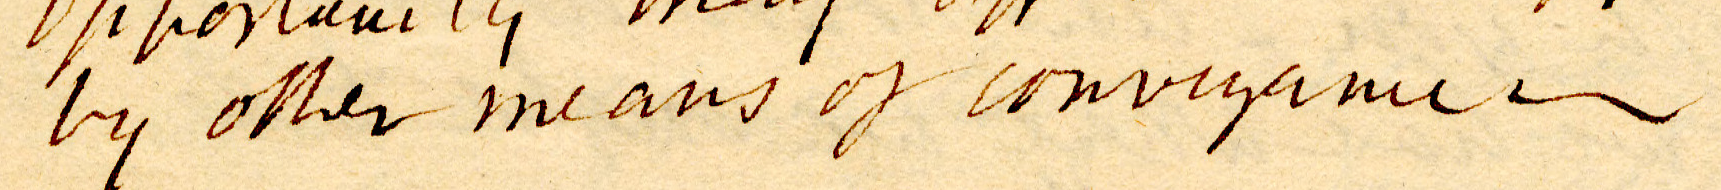by other means of conveyance-
